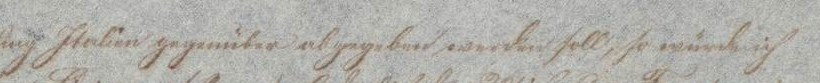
Italien gegenüber abgegeben werden soll, so würde ich
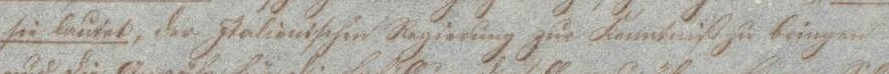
sie lautet, der Italienischen Regierung zur Kenntniß zu bringen
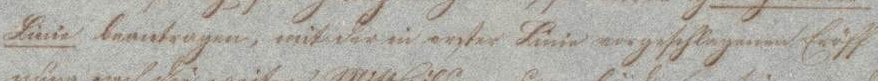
Linie beantragen, mit der in erster Linie vorgeschlagenen Eröff-
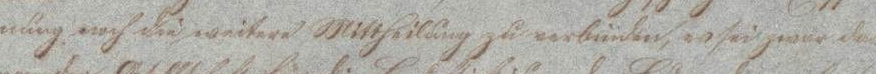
nung noch die weitere Mittheilung zu verbinden, es sei zwar das
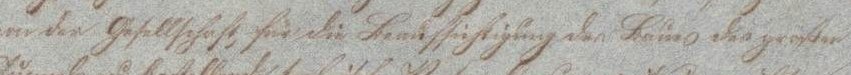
von der Gesellschaft für die Beaufsichtigung des Baues des großen
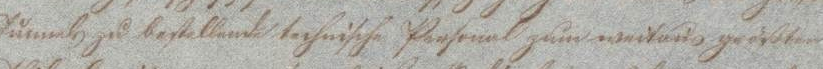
Tunnels zu bestellende technische Personal zum weitaus größten
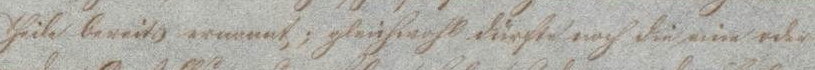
Theile bereits ernannt; gleichwohl dürfte noch die eine oder
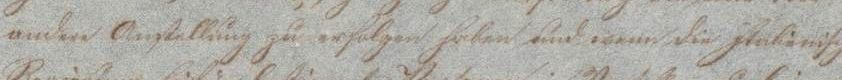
andere Anstellung zu erfolgen haben und wenn die Italienische
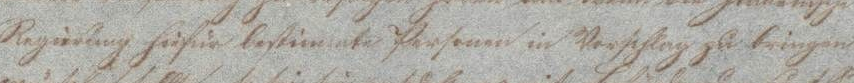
Regierung hiefür bestimmte Personen in Vorschlag zu bringen
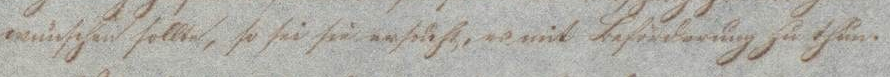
wünschen sollte, so sei sie ersucht, es mit Beförderung zu thun.
